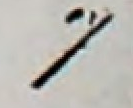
7
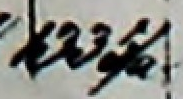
1335/a
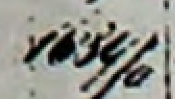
1689/a
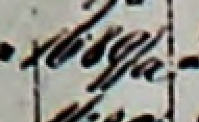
1689/a
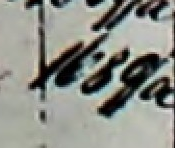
1689/a
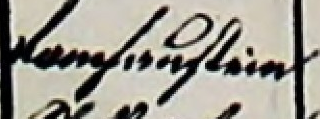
Ramsaustein
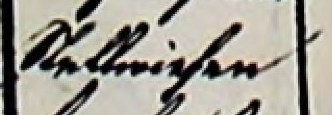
Stellwiesen
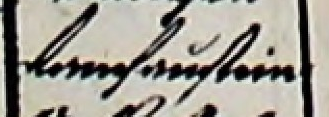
Ramsaustein
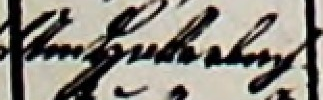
Am Hollenbach
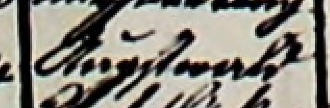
Augstwald
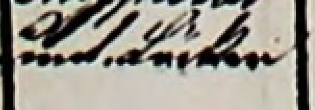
und Lücker
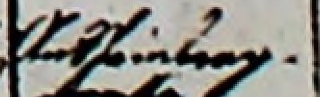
Aus??inberg=
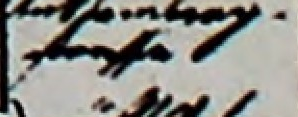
???sse
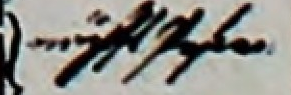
nächt Poser
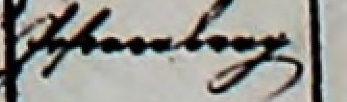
Posererberg
